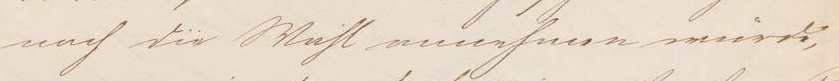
nach die Wahl annehmen würde,
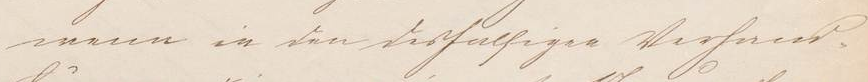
wenn in den desfalsigen Verhand-
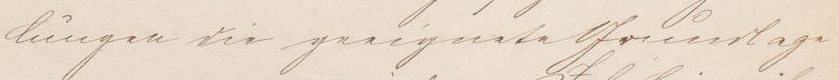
lungen die geeignete Grundlage
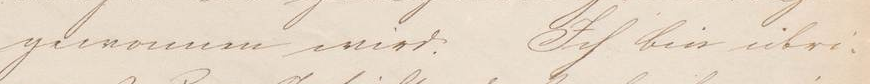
gewonnen wird. Ich bin übri-
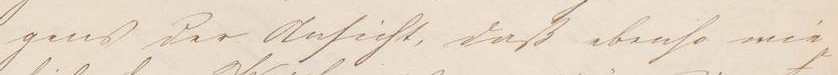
gens der Ansicht, daß ebenso wie
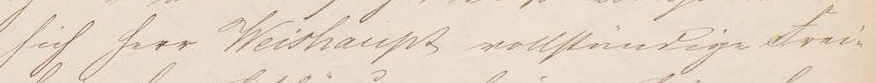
sich Herr Weishaupt vollständige Frei-
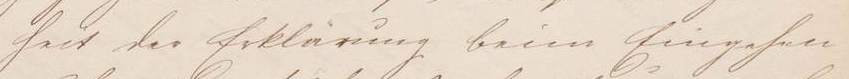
heit der Erklärung beim Eingehen
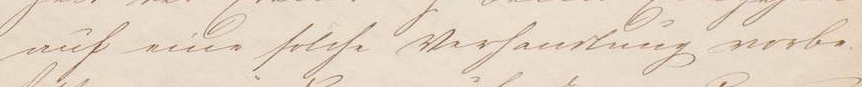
auf eine solche Verhandlung vorbe-
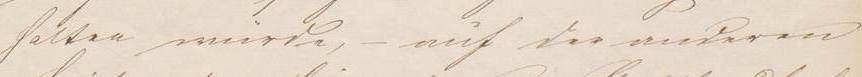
halten würde, – auf der anderen
